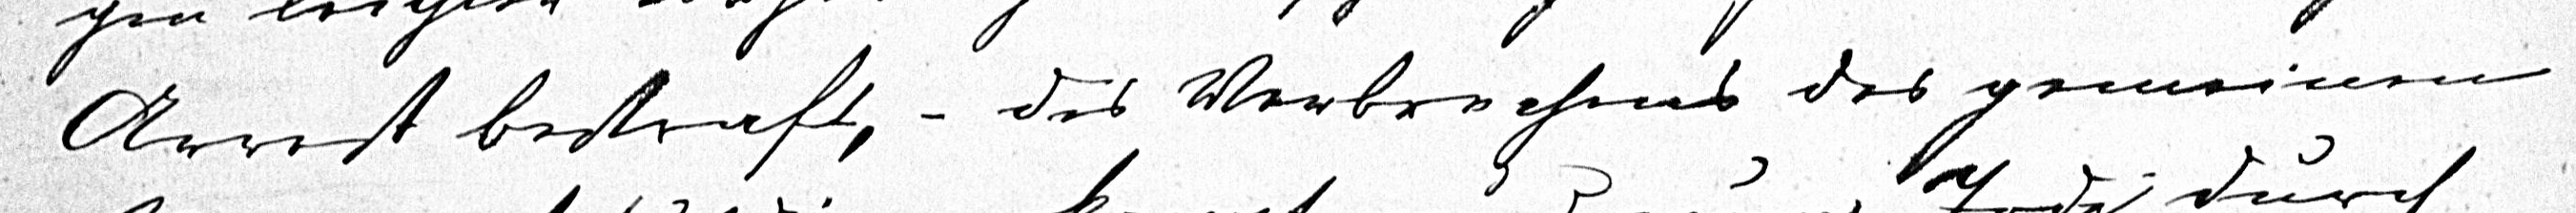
Arrest bestraft, - des Verbrechens des gemeinen
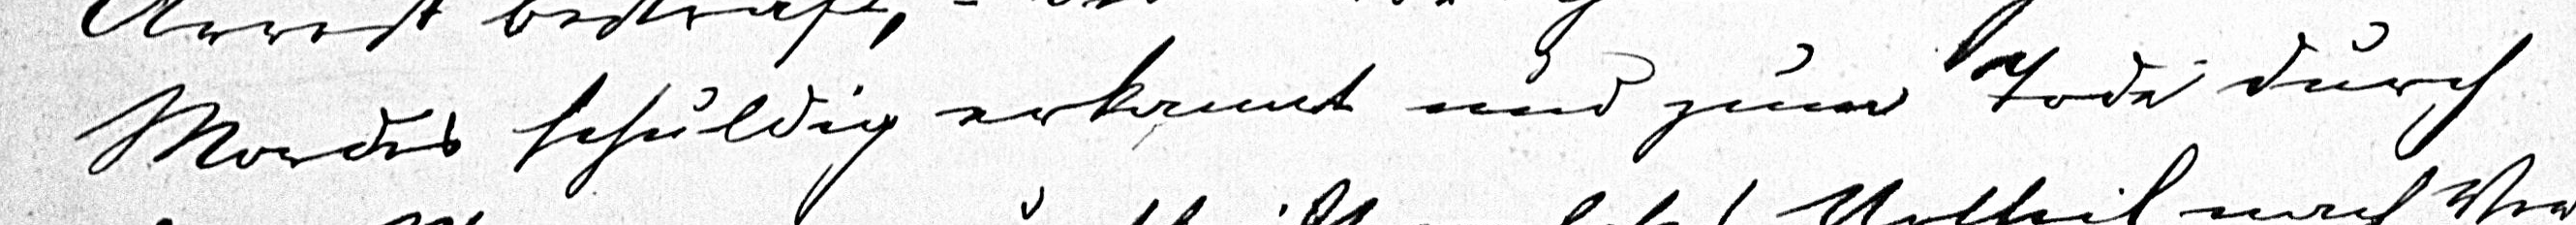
Mordes schuldig erkannt und zum Tode durch
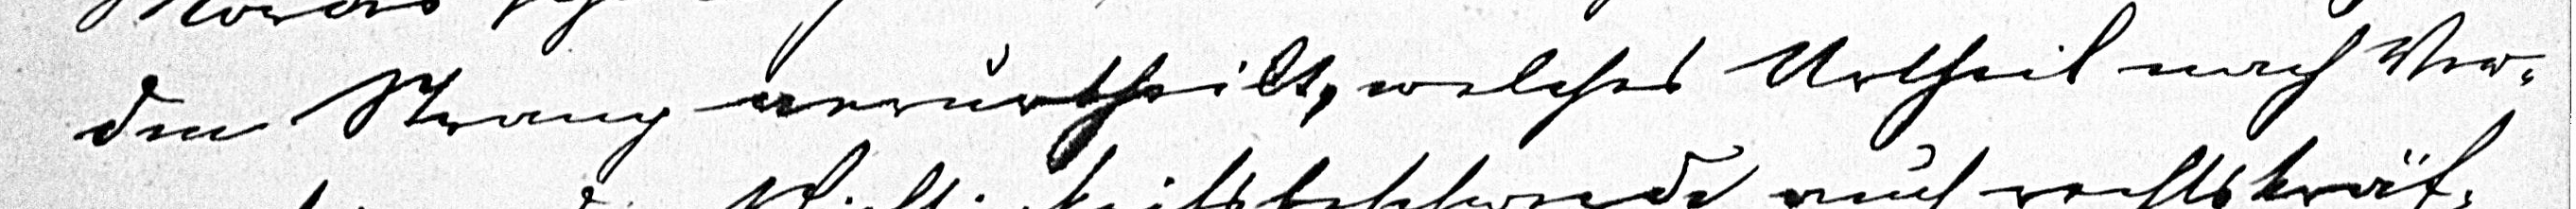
den Strang verurtheilt, welches Urtheil nach Ver¬
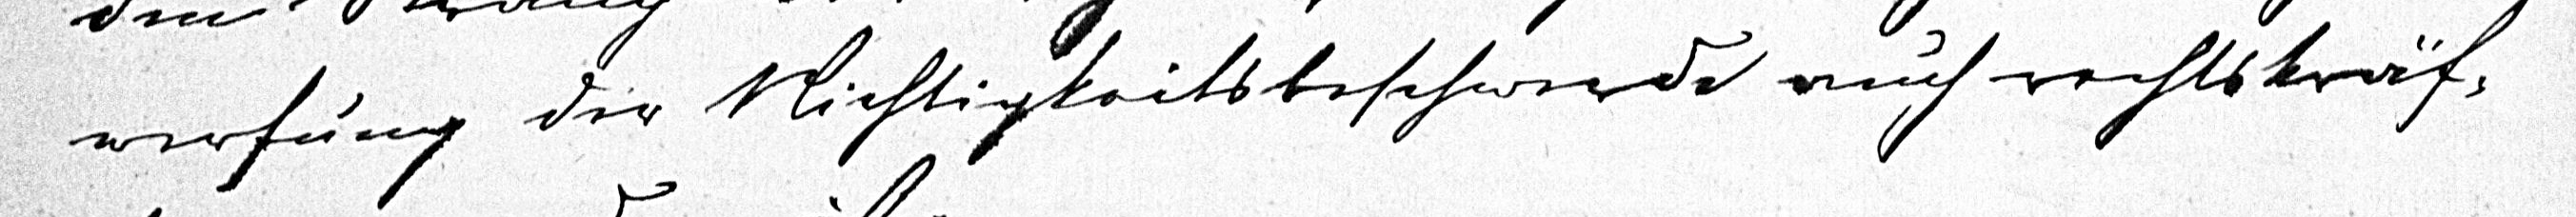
werfung die Nichtigkeitsbeschwerde auch rechtskräf¬
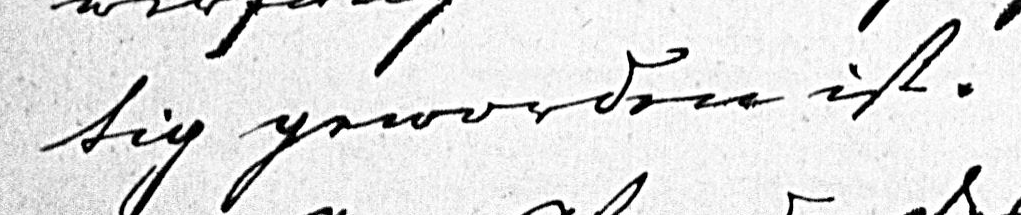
tig geworden ist.
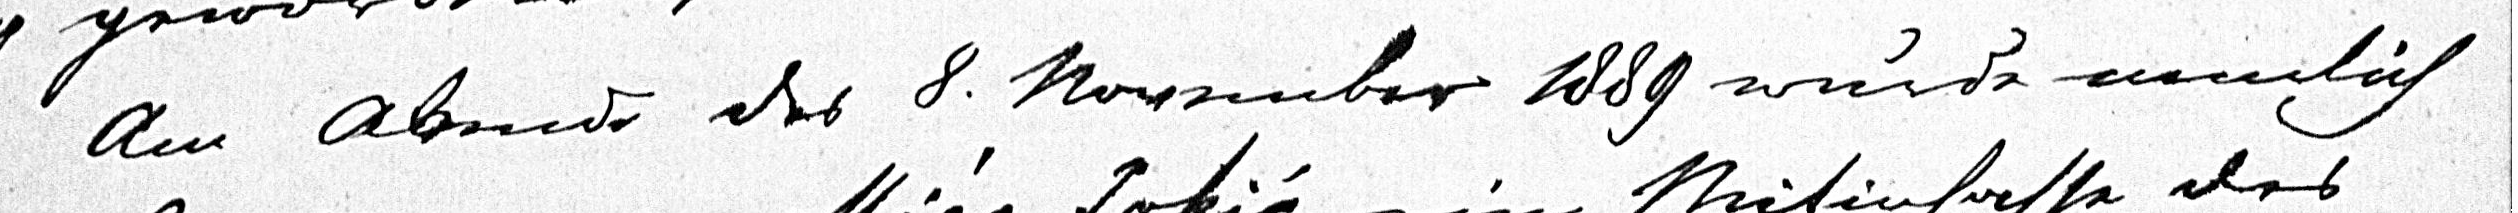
Am Abends des 8. November 1889 wurde nemlich
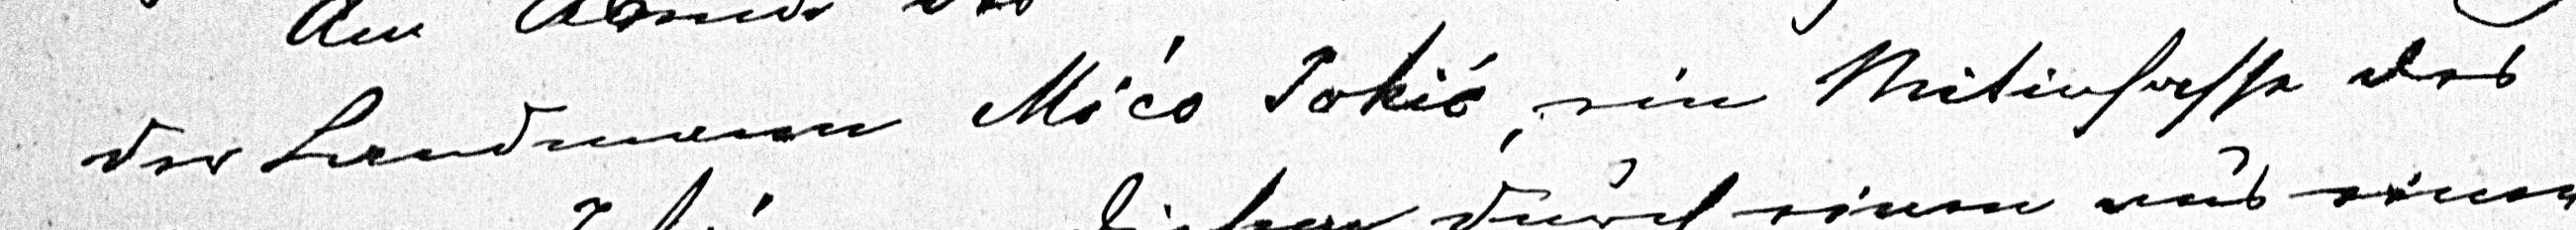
der Landmann Mićo Jokić, ein Mitinsasse des
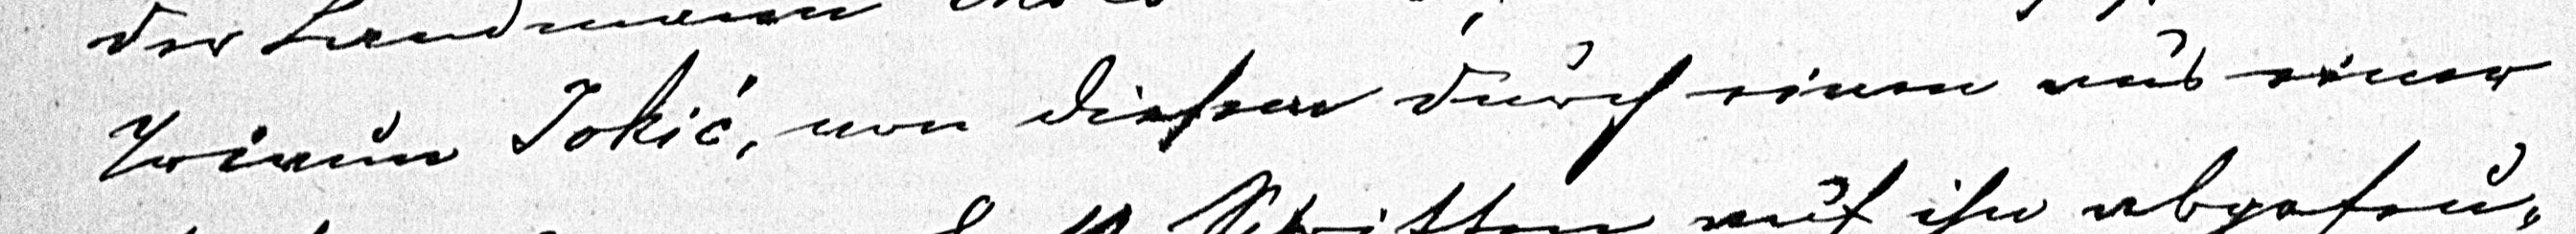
Trivun Jokić, von diesem durch einen aus einer
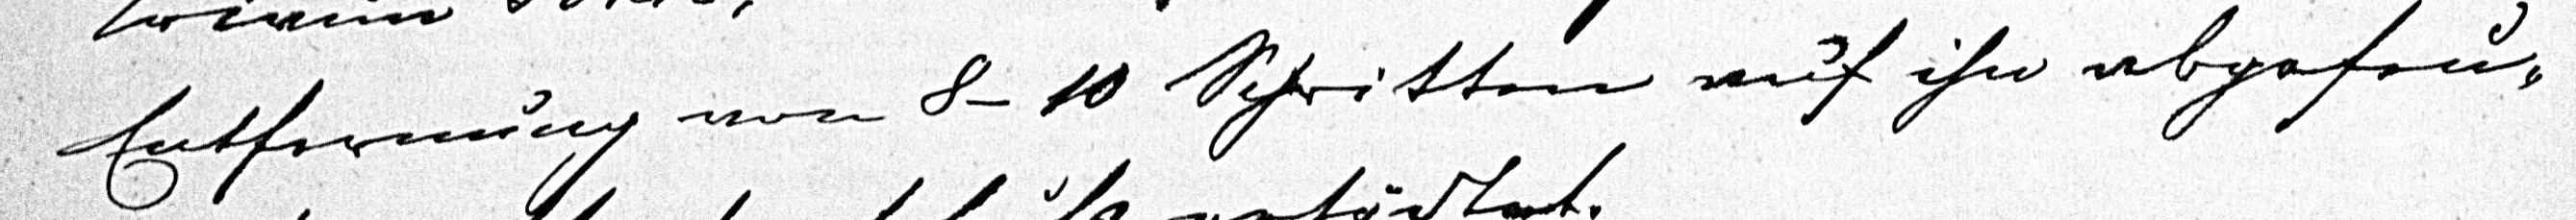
Entfernung von 8-10 Schritten auf ihn abgefeu¬
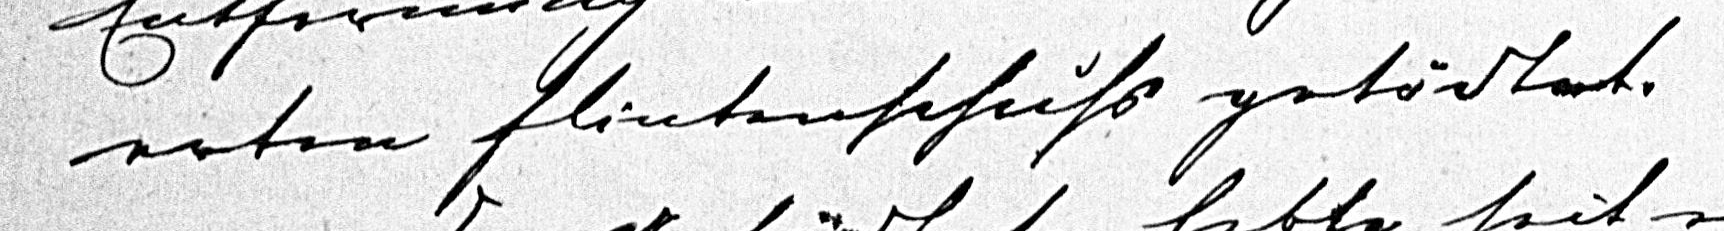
erten Flintenschuss getödtet.
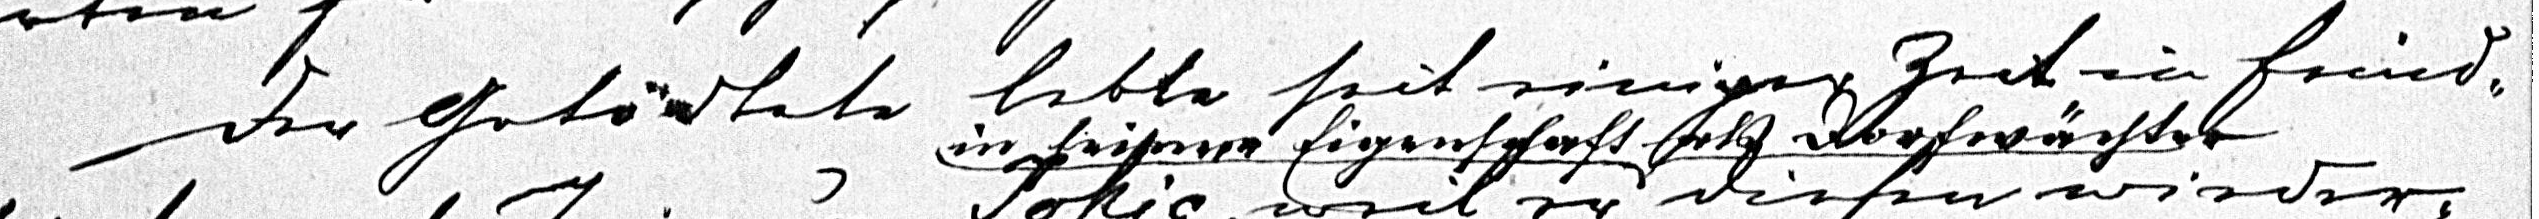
Der Getödtete lebte seit einiger Zeit in Feind¬
